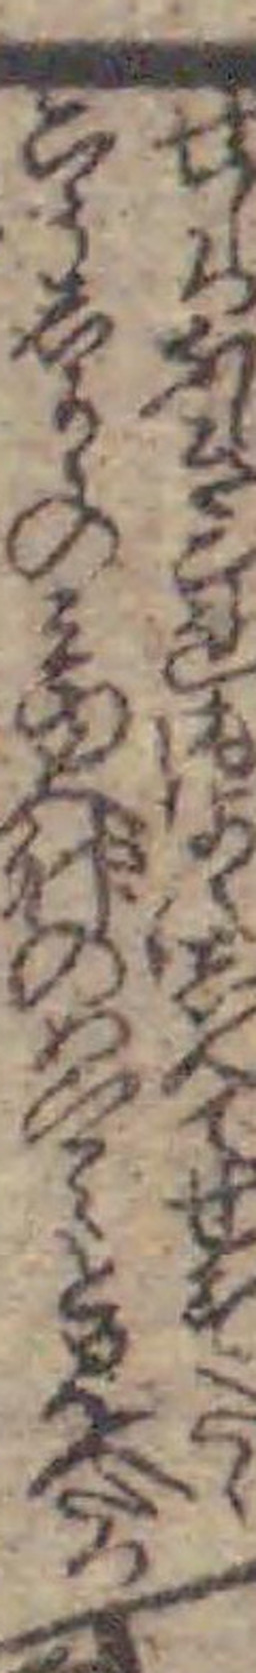こうしよくのみゆへ神のめぐみと見へたり
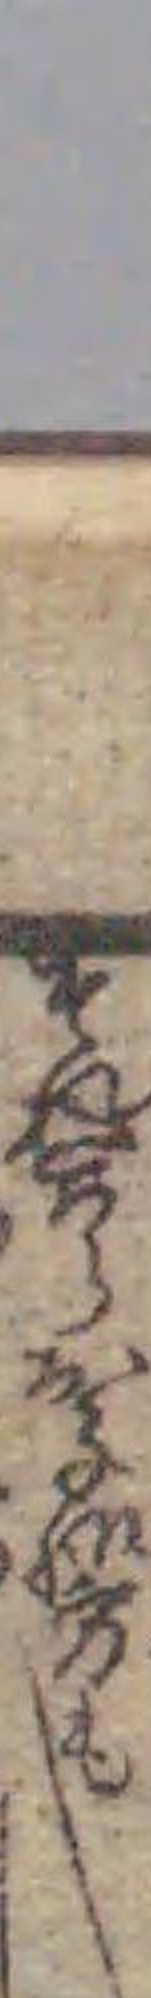それたからお子様方も
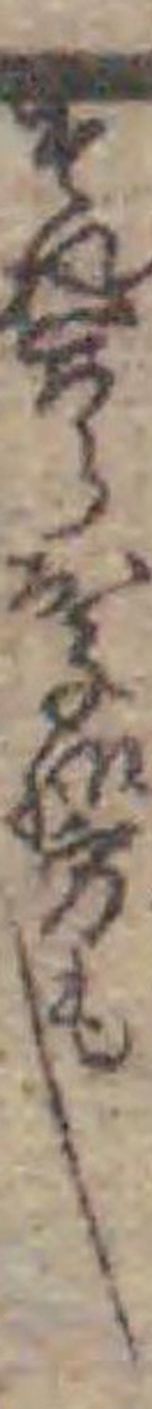それたからお子様方も
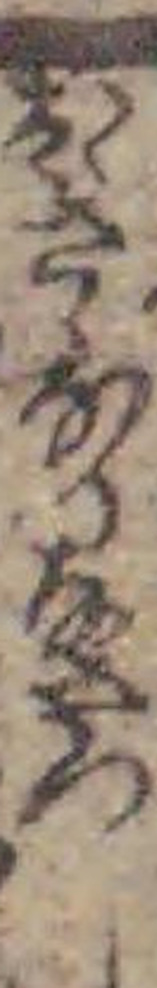おヽきくなりなさつ
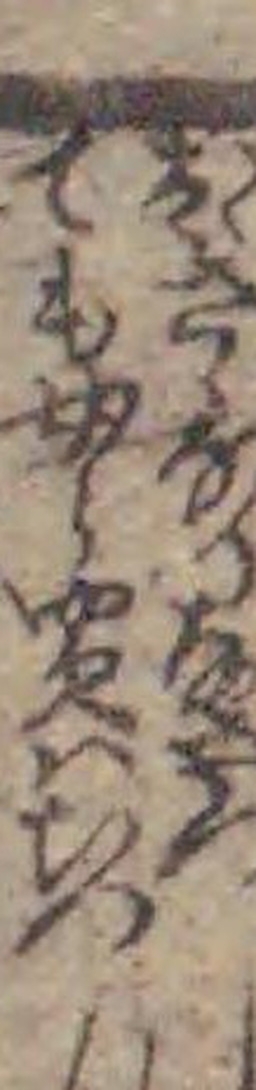ても女郎買いちつ
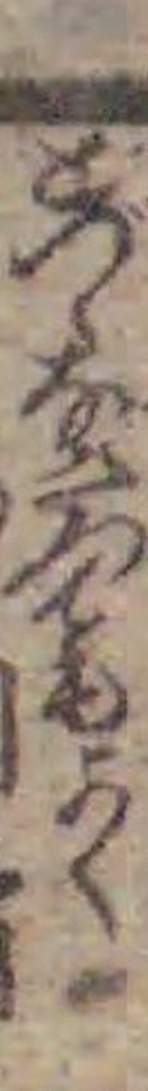とづゝなさつてもよく
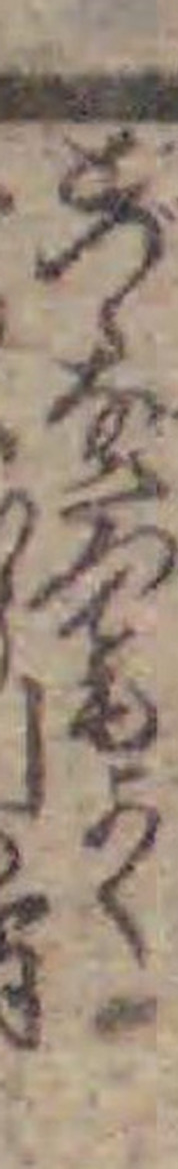とづゝなさつてもよく
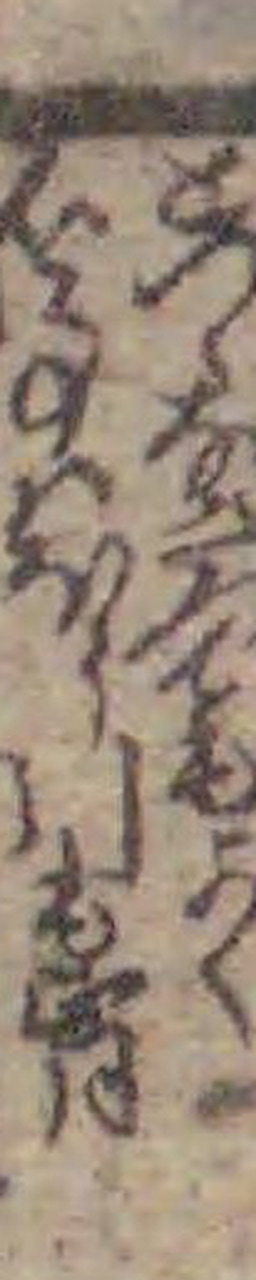かけ事はほう引も正月

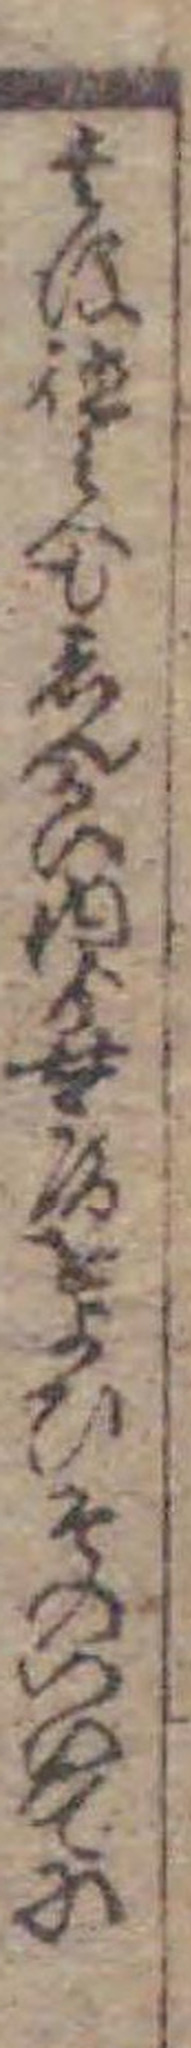其後徳兵へもしんるい内より女房をよひそのついでに
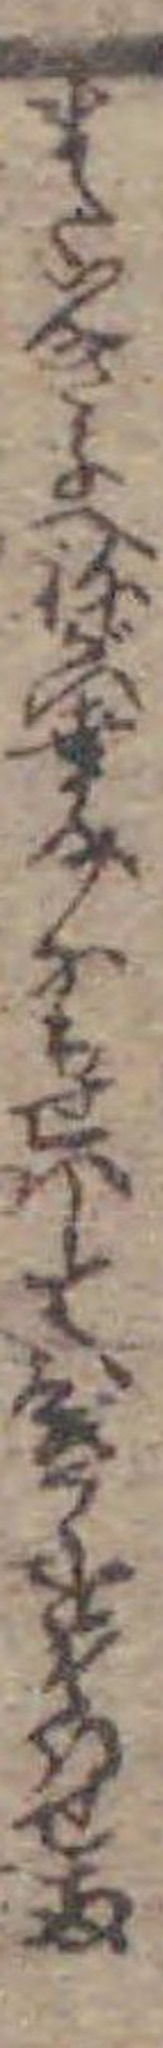またいんきよへねがい幸介にもせはしておきくをそはせ両
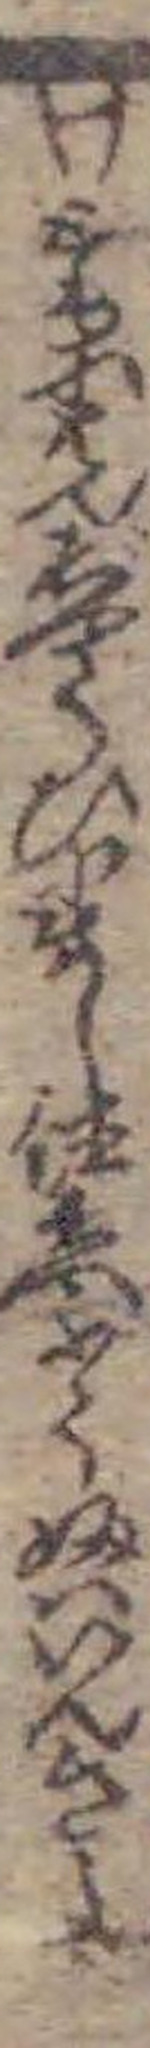けともにはんじやうひにまし徳兵へふうふはいんきよ
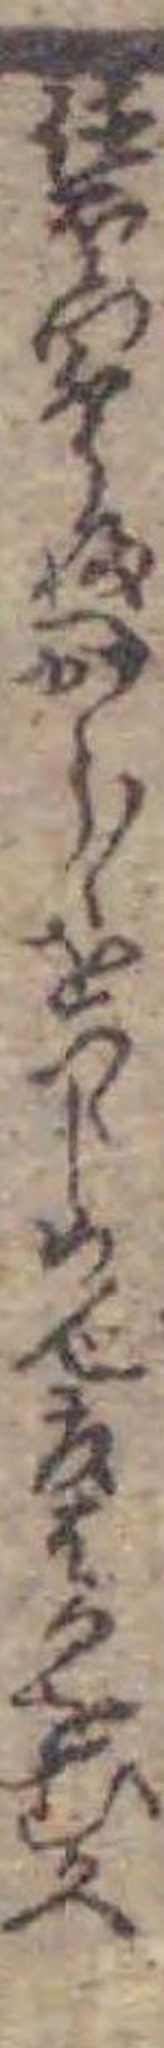徳右衛門ふうふへかう〳〵をつくしめで度はるをむかへ
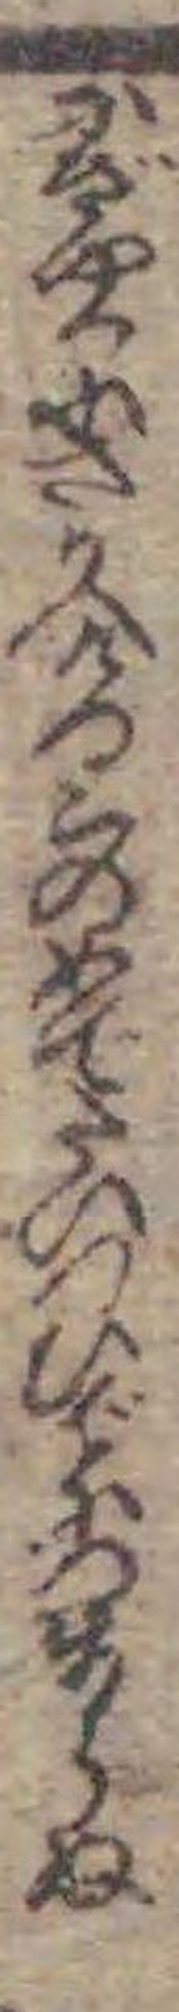にぎやかにさかへけるこのめでたいついでにつまらぬ
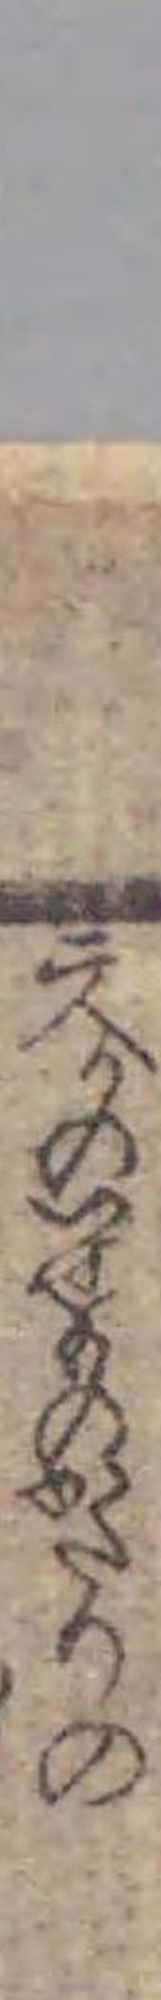二人りのいせものかたりの
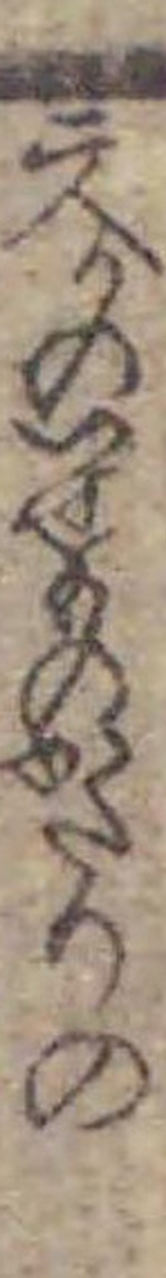二人りのいせものかたりの
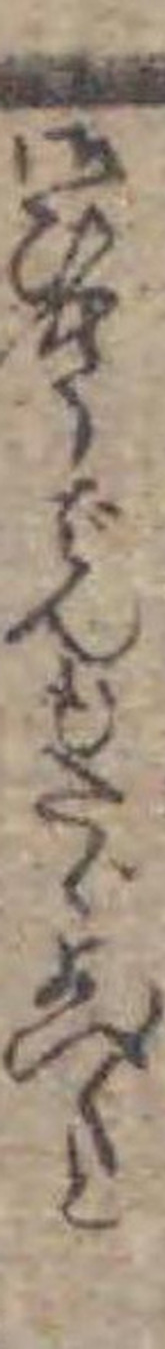御ひやうばんもたゞよい〳〵と
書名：通風伊勢物語 : 3巻
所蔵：国立国会図書館 National Diet Library, JAPAN
